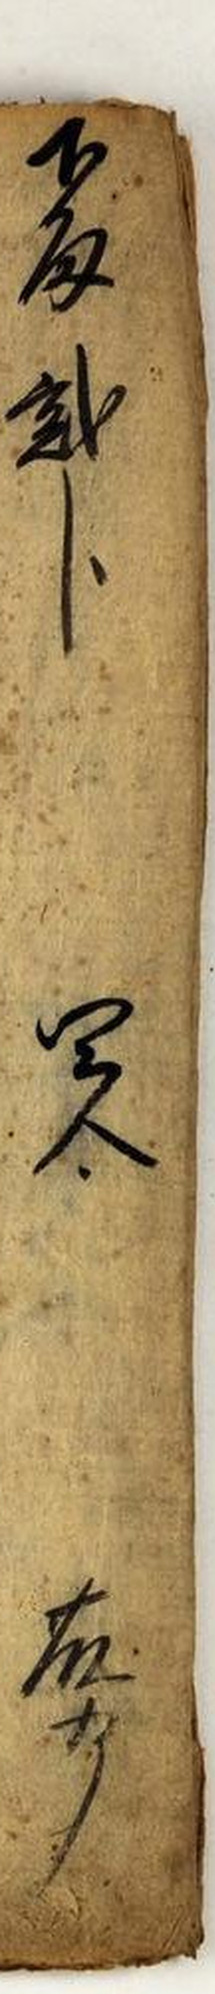下畠弐分四合藤九郎
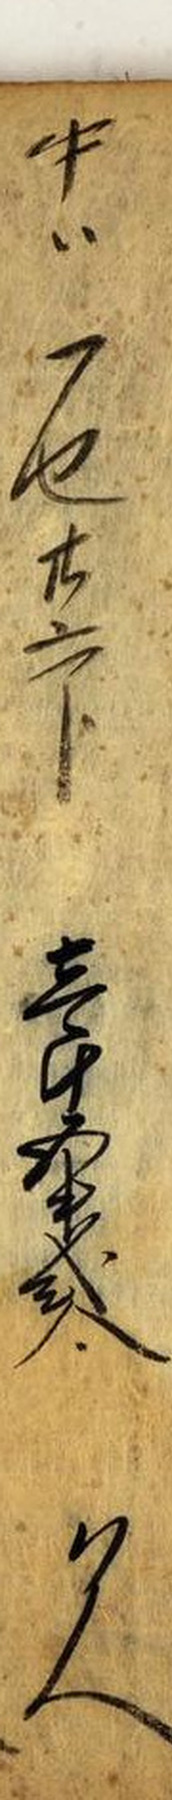中同一セ廿六分壱斗五升弐合同人
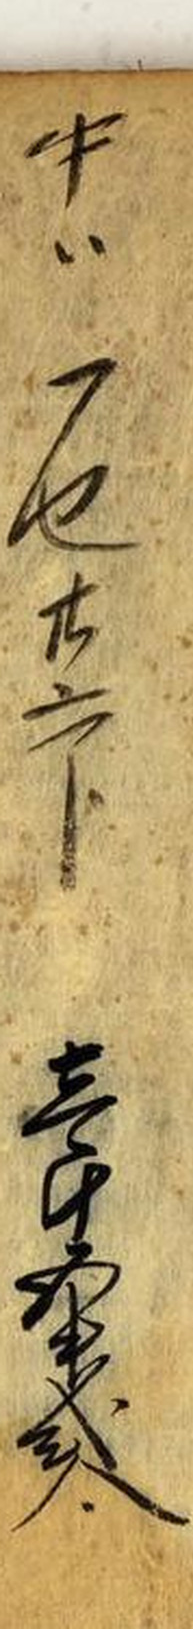中同一セ廿六分壱斗五升弐合同人
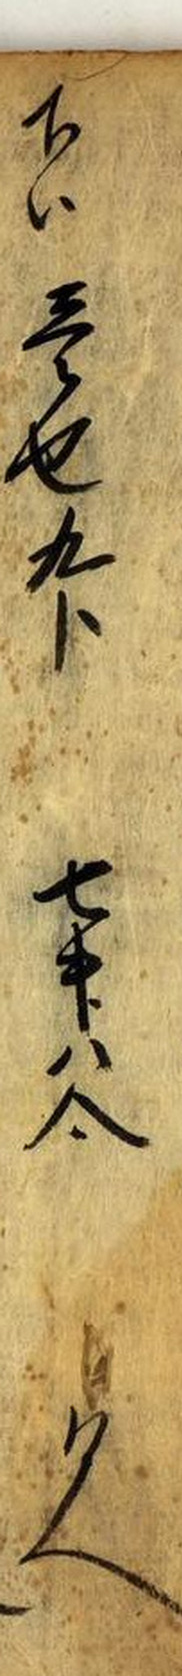下同壱セ九分七升八合同人
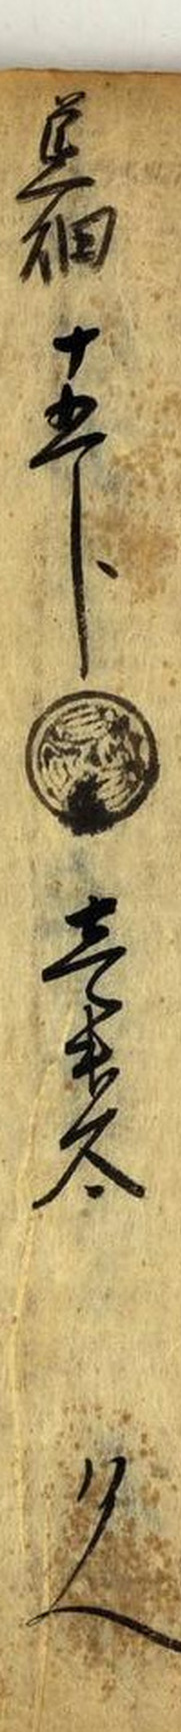荒畑十五分㊞壱升五合同人
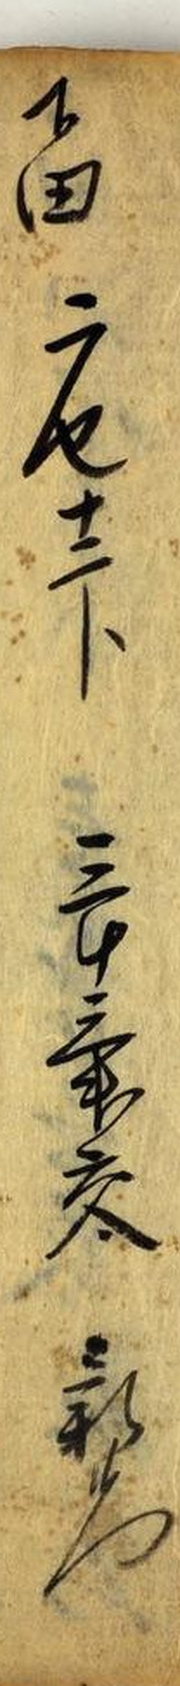下田二セ十二分三斗三升六合新右衛門
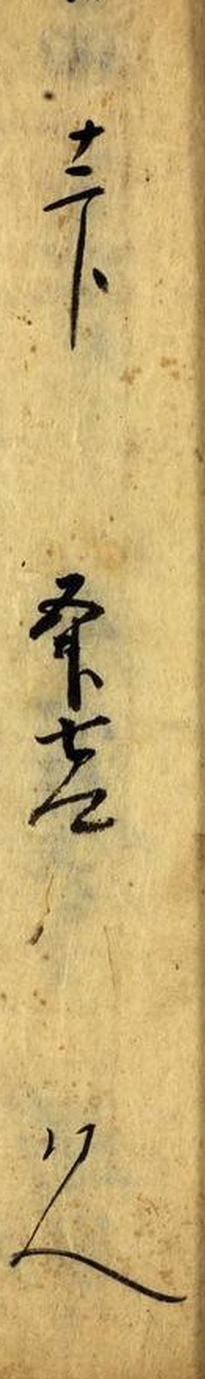同十二分五升七合同人
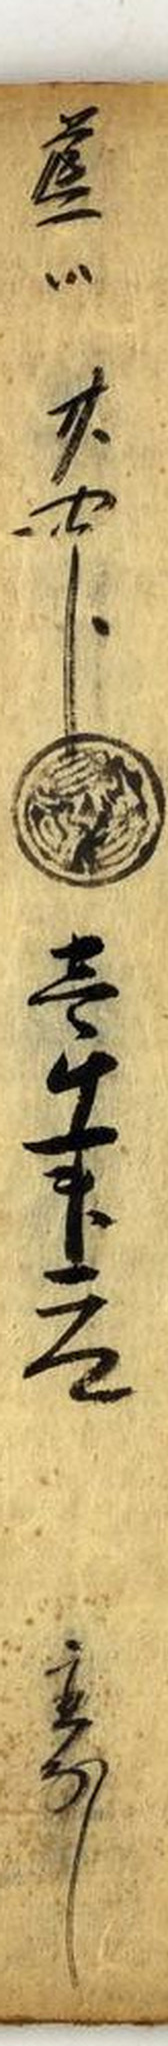荒同廿四分㊞壱斗一升一合主なし
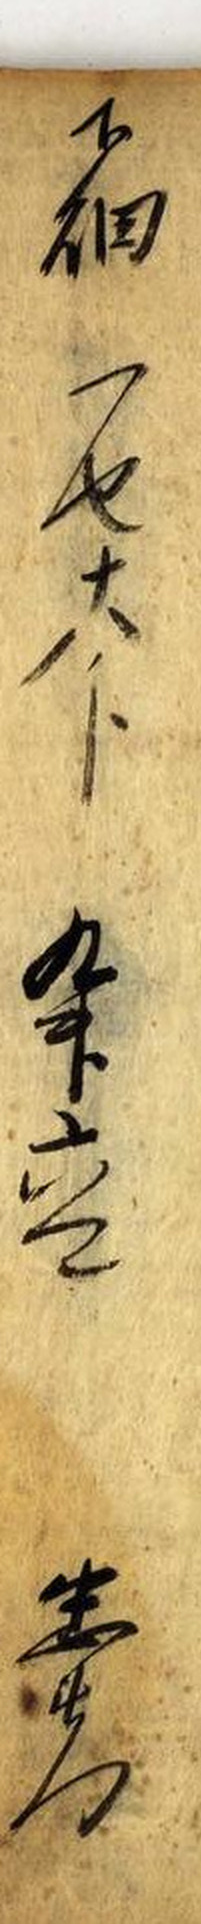下畑一セ十八分九升六合忠右衛門
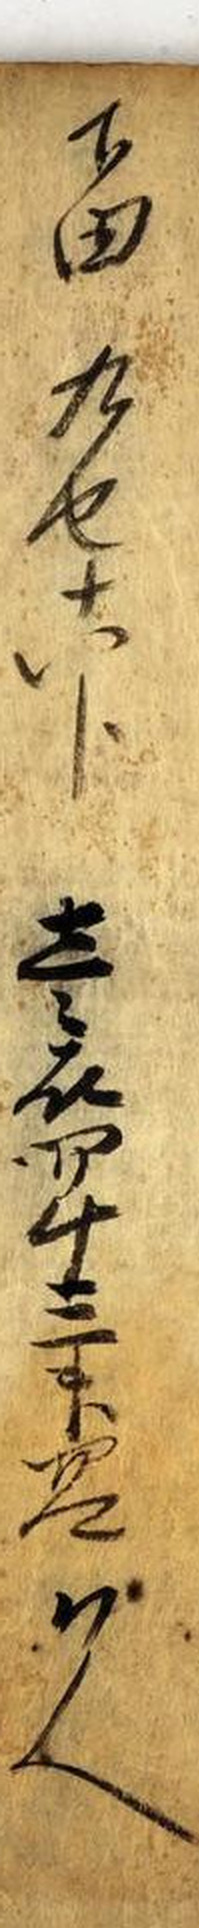下田九セ十八分壱石四斗三升四合同人
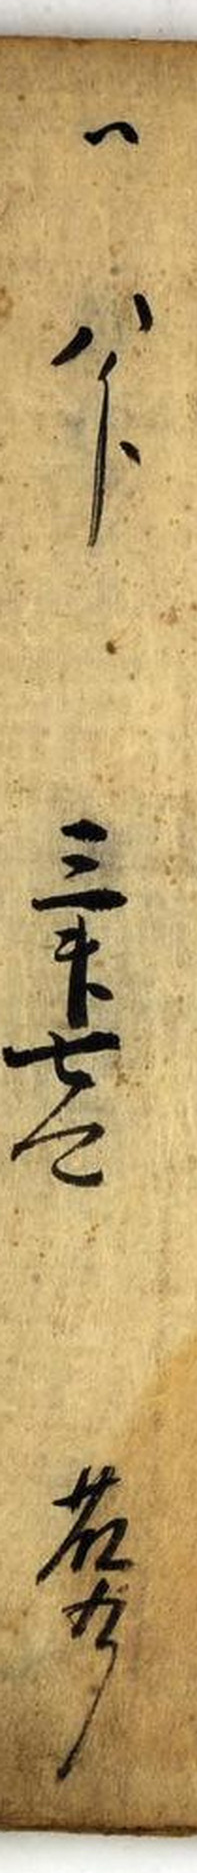同八分三升七合藤九郎

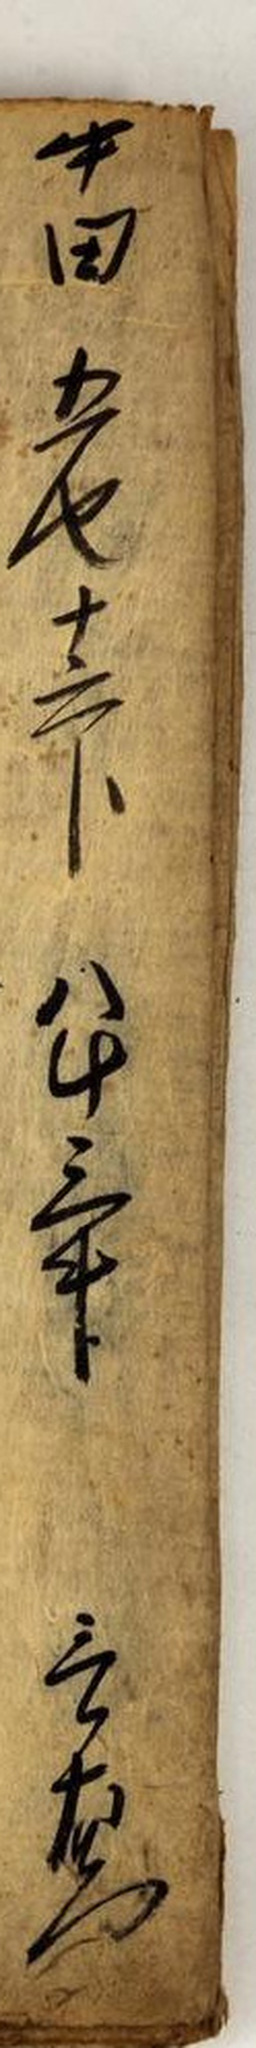中田五セ十六分八斗三升三郎左衛門
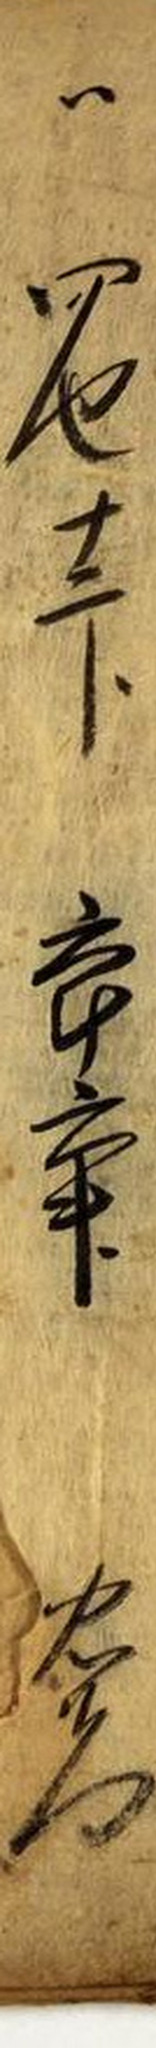同四セ十二分六斗六升忠右衛門
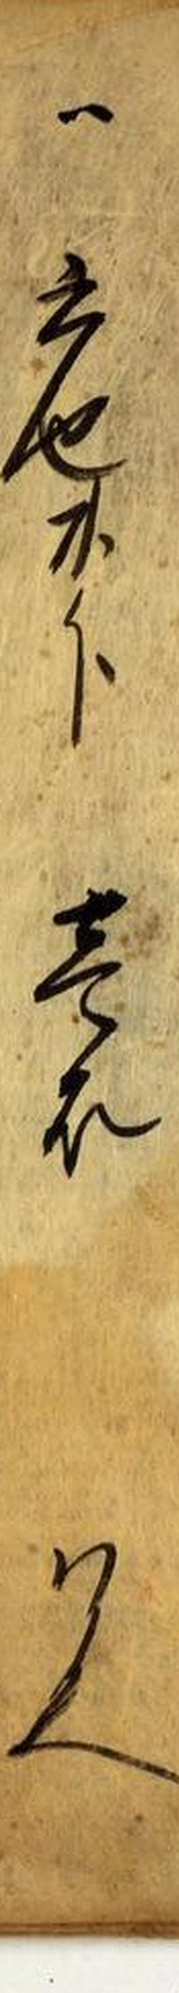同六セ廿分壱石同人
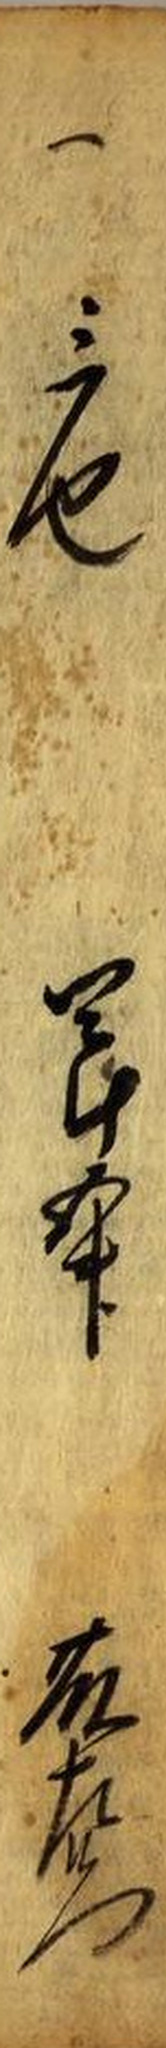同三セ四斗五升藤左衛門
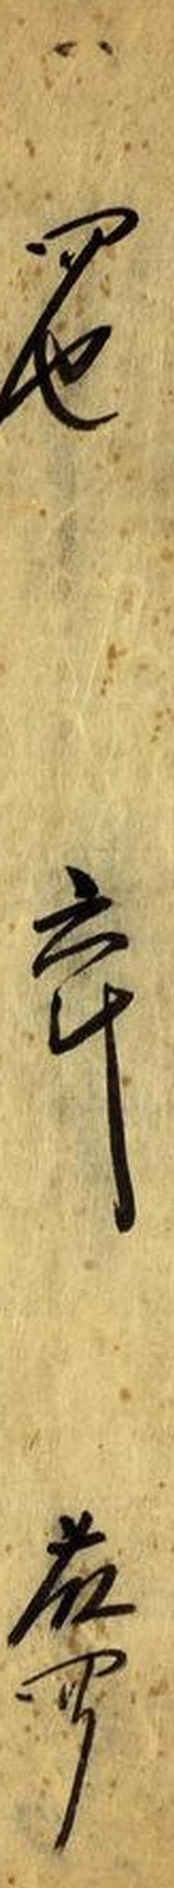同四セ六斗藤四郎
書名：越前国西方内志津庄内本折村御検地帳
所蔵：福井県文書館 Fukui Prefectural Archives
